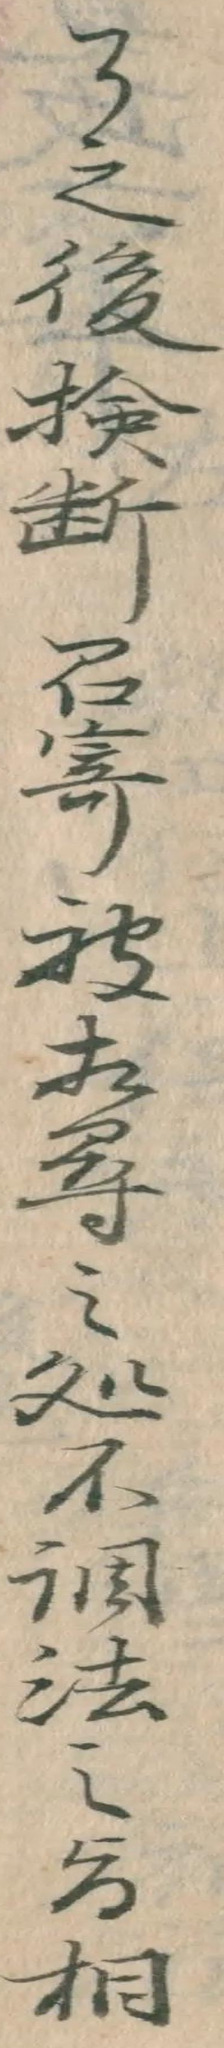了之後検断召寄被相尋之処不調法之旨相
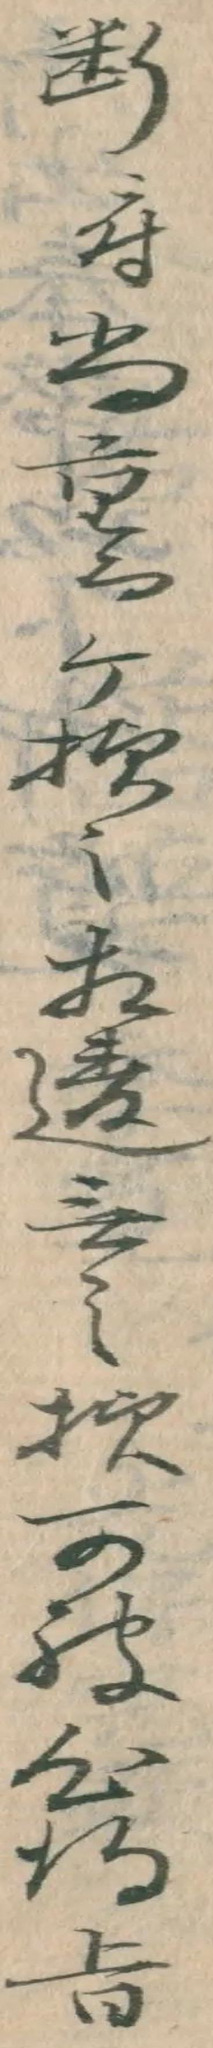断ニ付尚重而ケ様之相違無之様可被心得旨
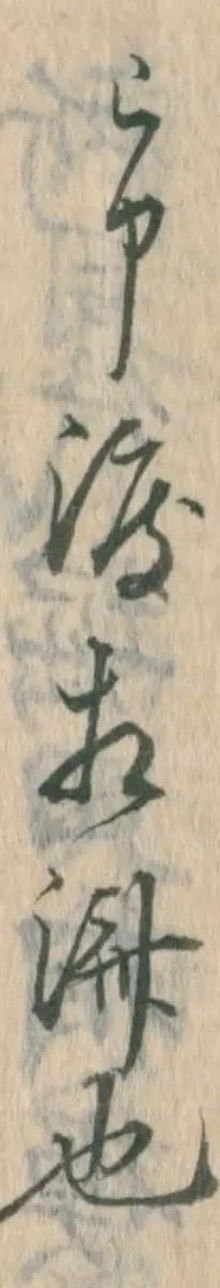被申渡相済也

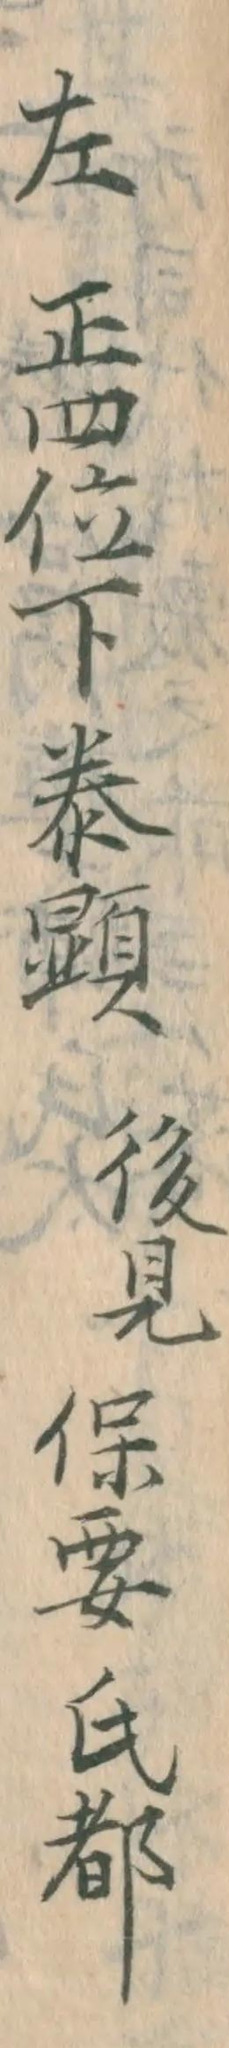左正四位下泰顕後見保要氏都
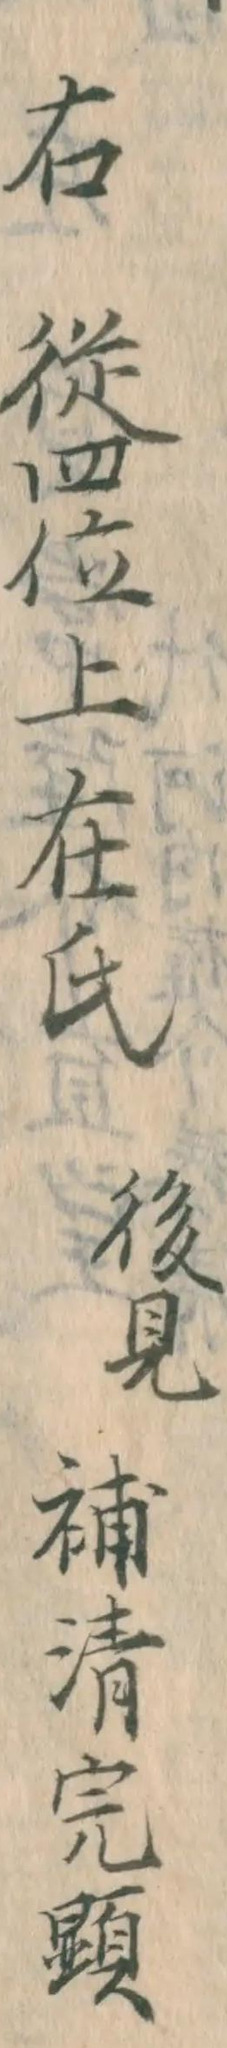右従四位上在氏後見補清完顕
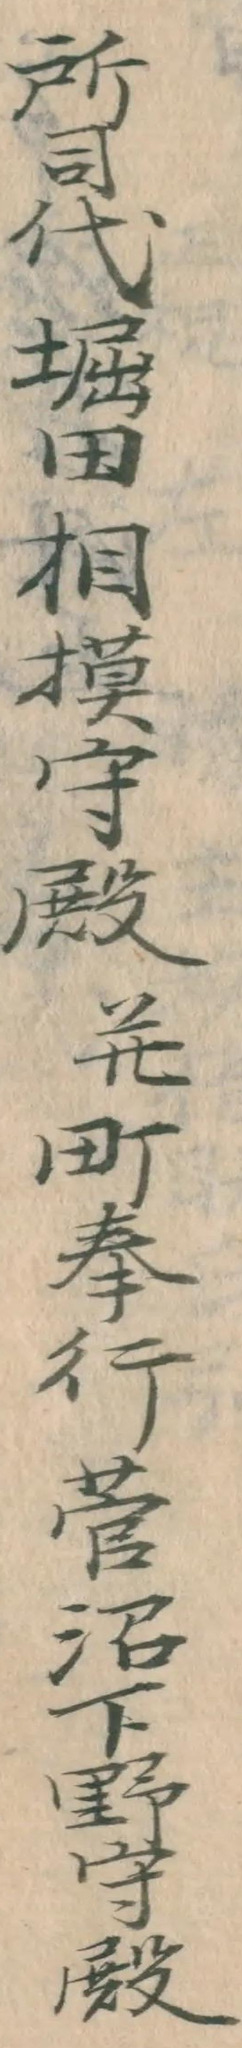所司代堀田相模守殿并町奉行菅沼下野守殿
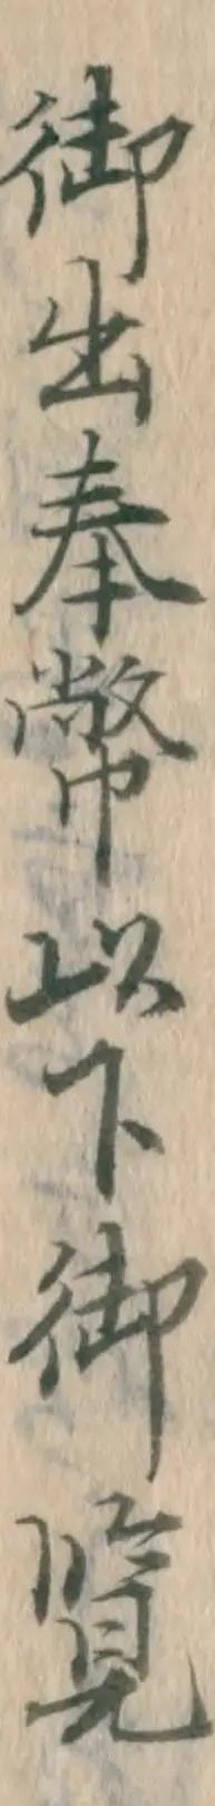御出奉幣以下御覧
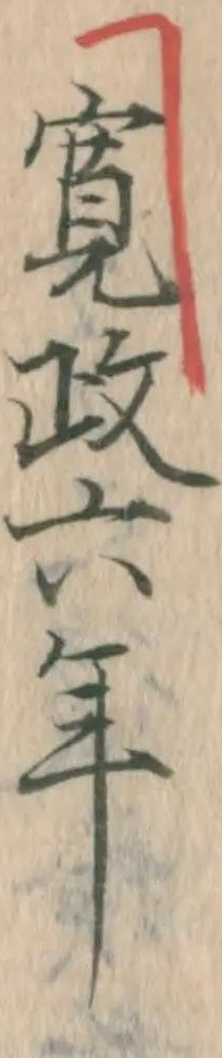寛政六年
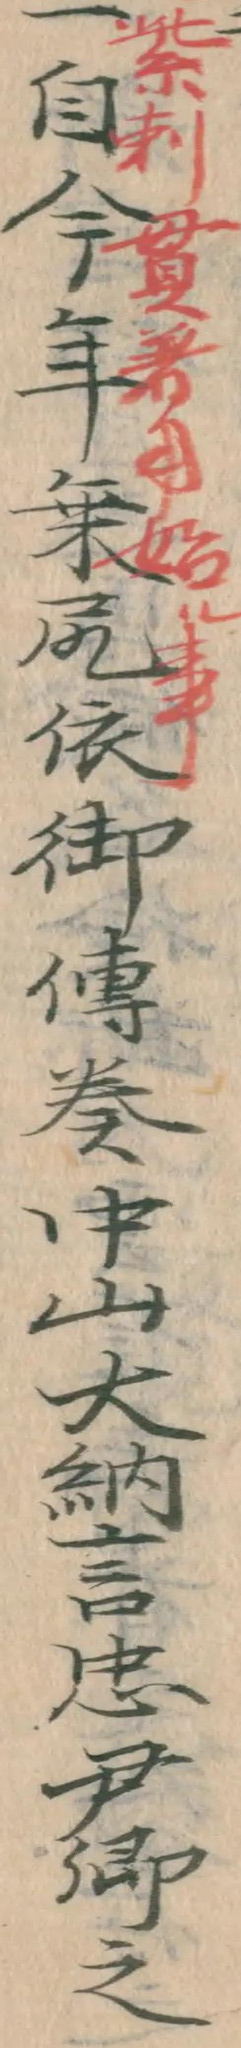一自今年乗尻依御伝奏中山大納言忠尹卿之
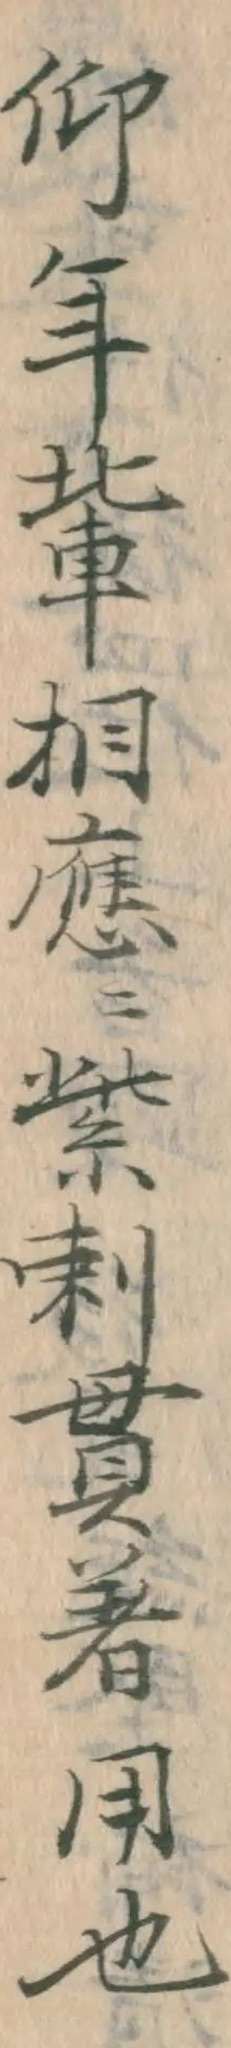仰年軰相応ニ紫刺貫着用也
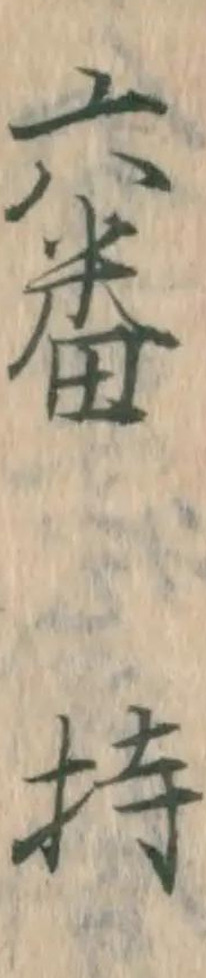六番持
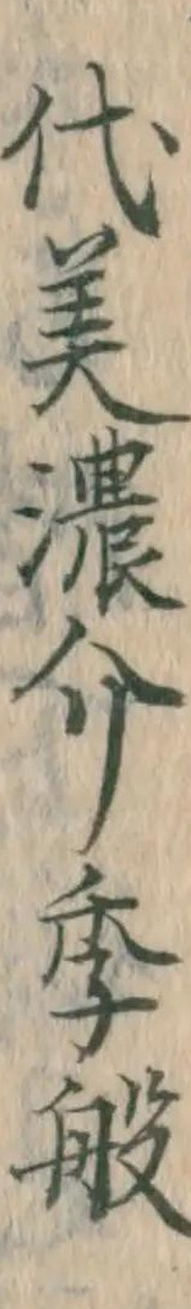代美濃介季般
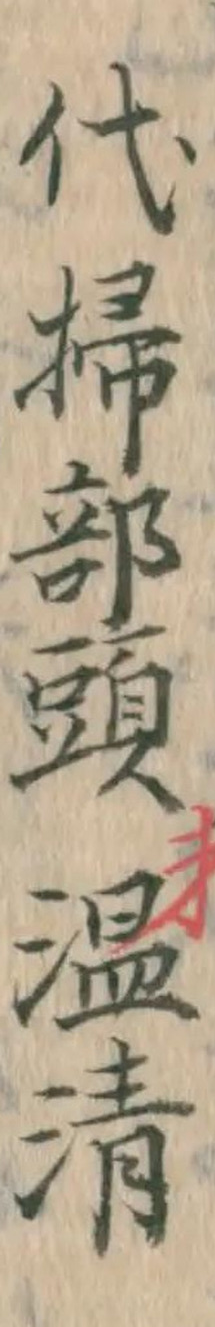代掃部頭温清
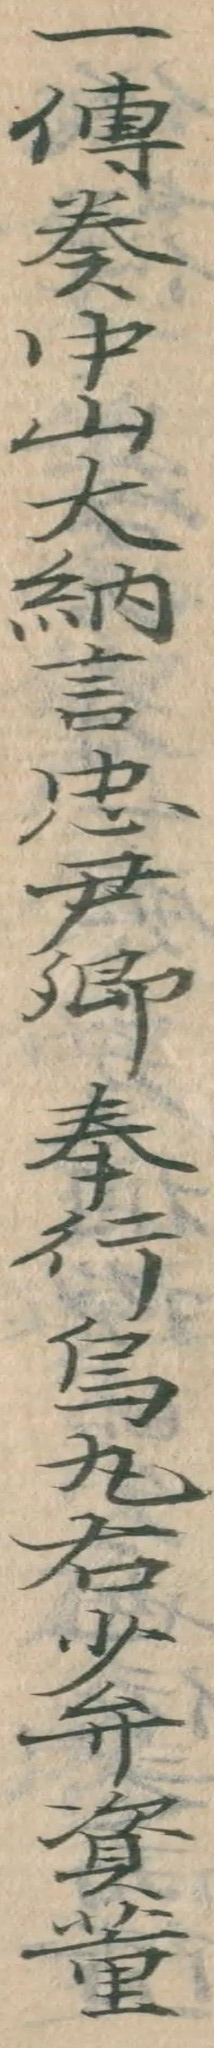一伝奏中山大納言忠尹卿奉行烏丸右少弁資菫
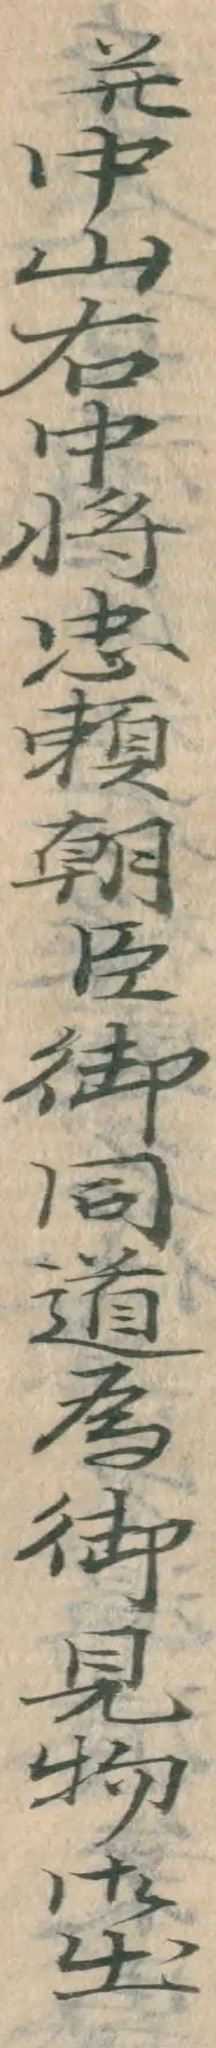并中山右中将忠頼朝臣御同道為御見物御出
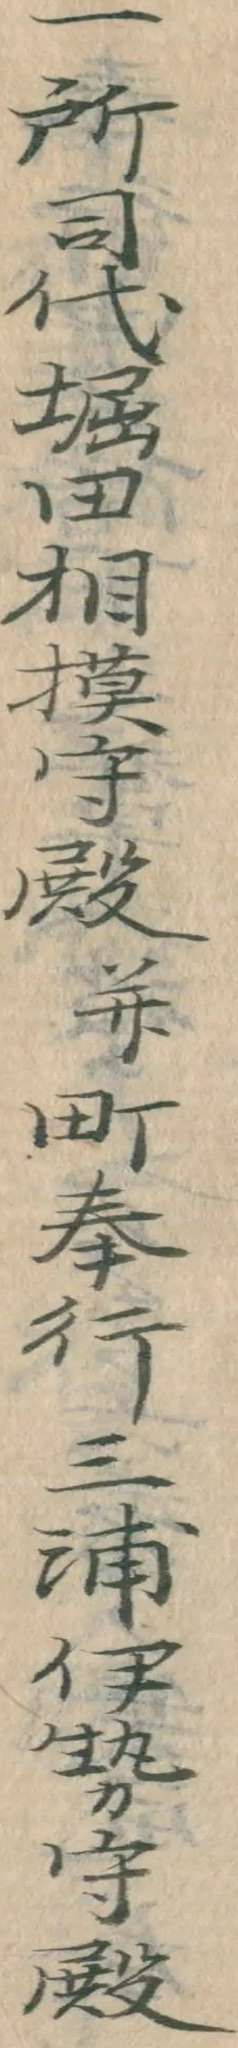一所司代堀田相模守殿并町奉行三浦伊勢守殿
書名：賀茂社記録. 第10冊
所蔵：国立国会図書館 National Diet Library, JAPAN
